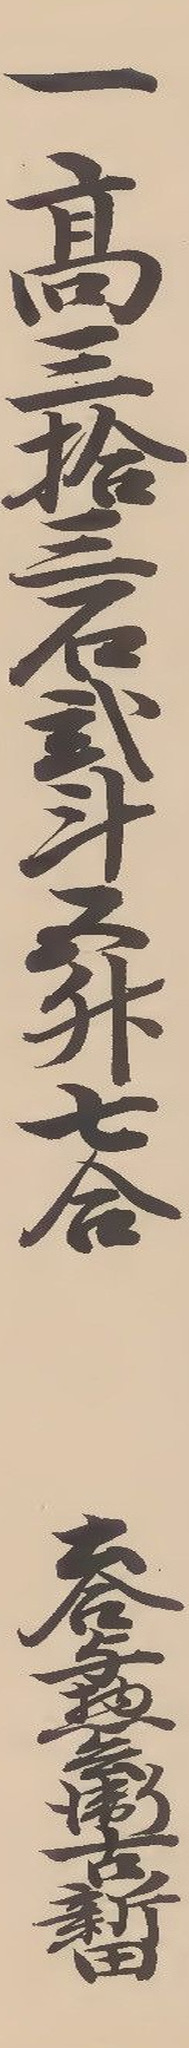一高三拾三石弐斗五升七合土合与惣兵衛古新田
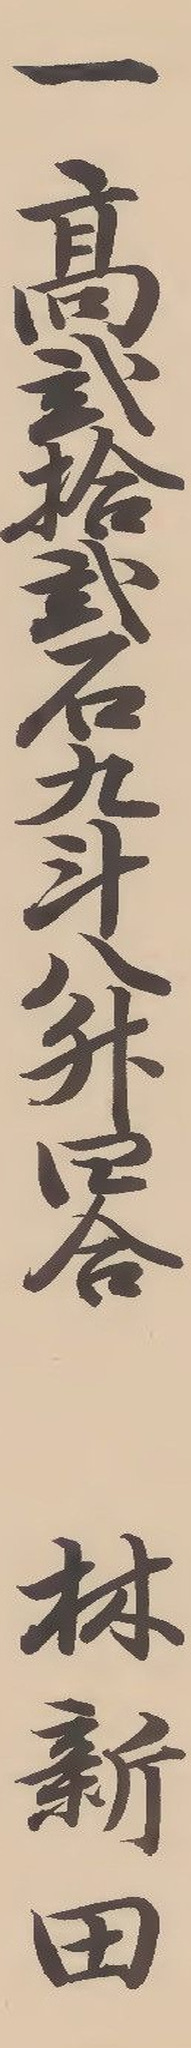一高弐拾弐石九斗八升四合林新田
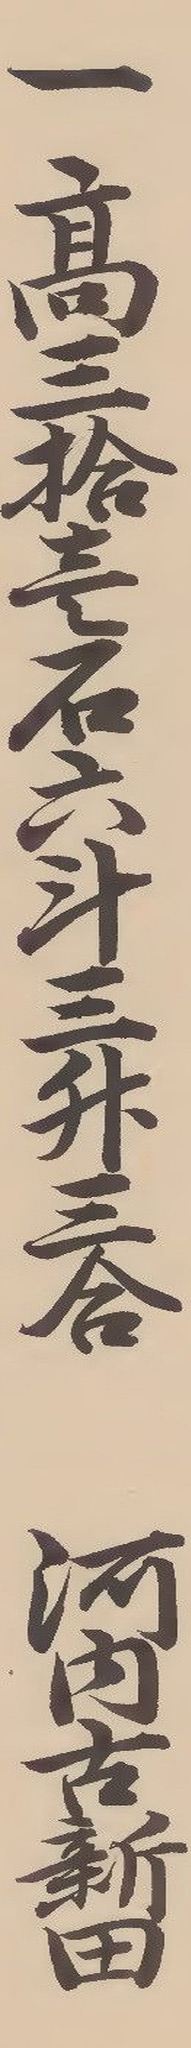一高三拾壱石六斗三升三合河内古新田
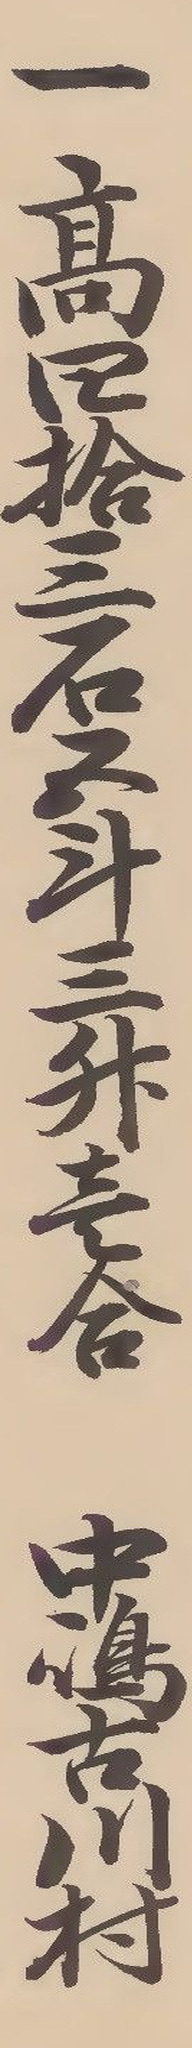一高四拾三石五斗三升壱合中島古川村

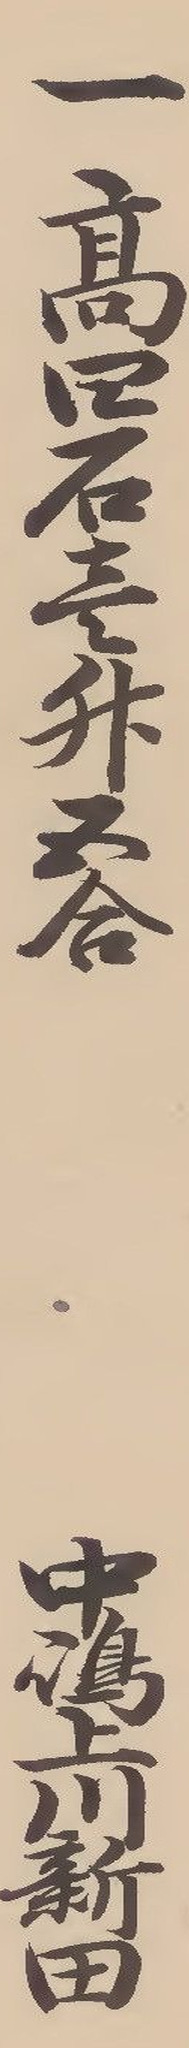一高四石壱升五合中島上川新田
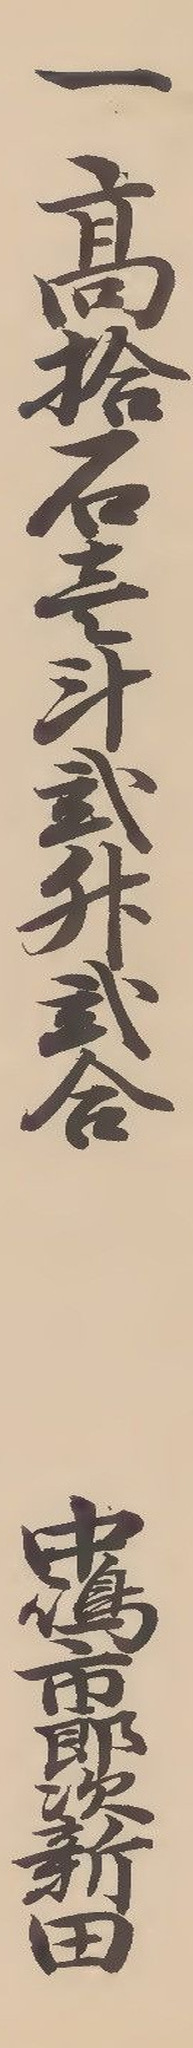一高拾石壱斗弐升弐合中島市郎次新田
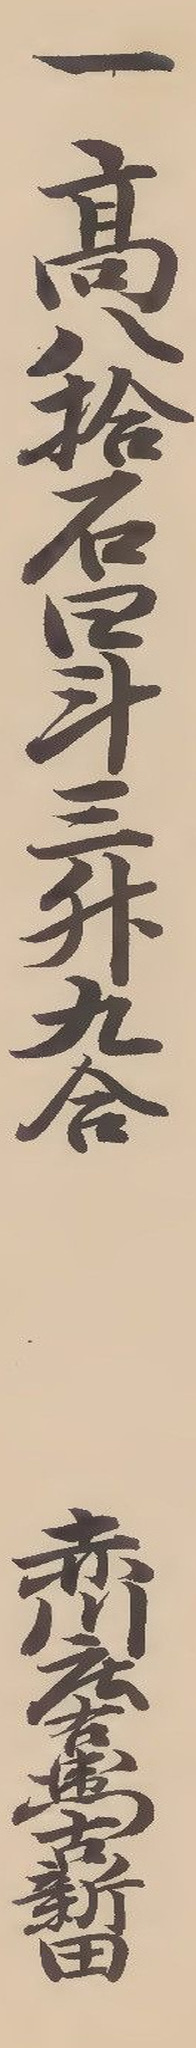一高八拾石四斗三升九合赤川庄右衛門古新田
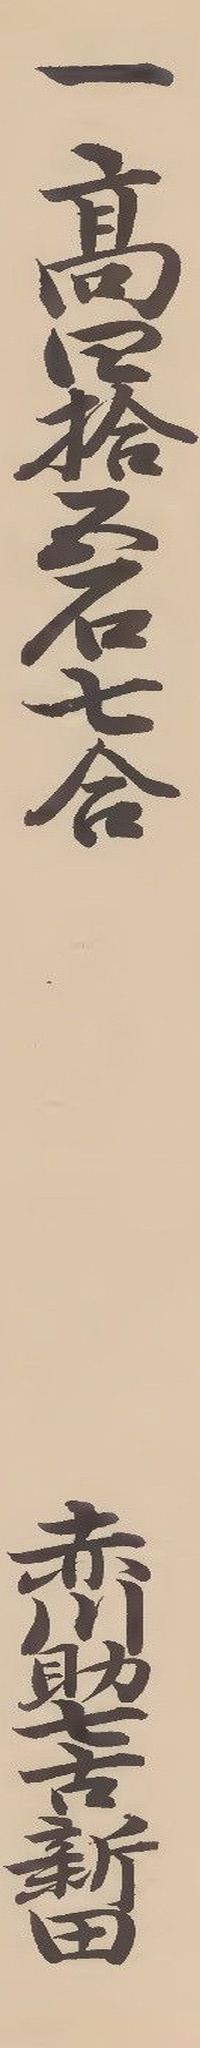一高四拾五石七合赤川助七古新田
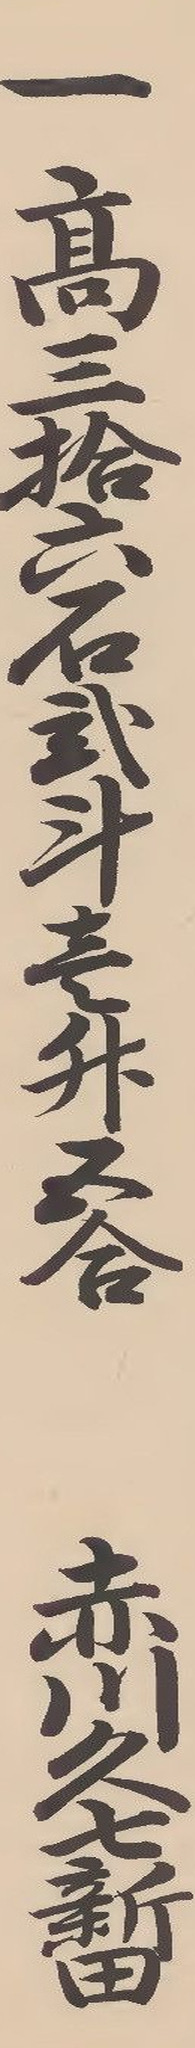一高三拾六石弐斗壱升五合赤川久七新田
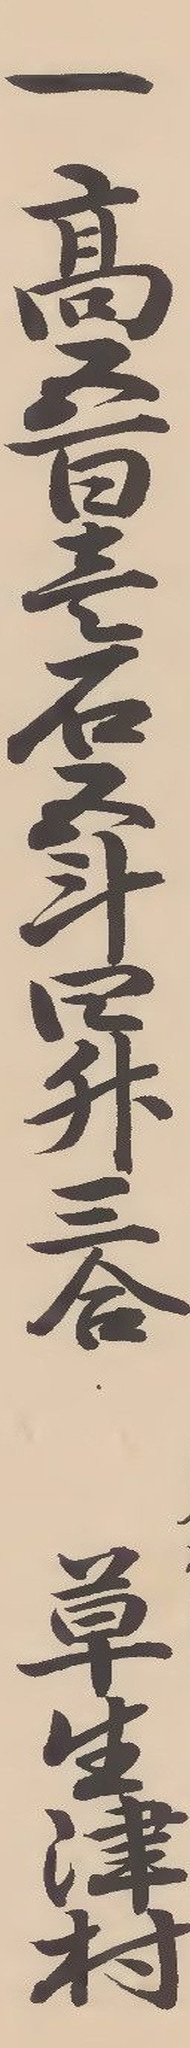一高五百壱石五斗四升三合草生津村
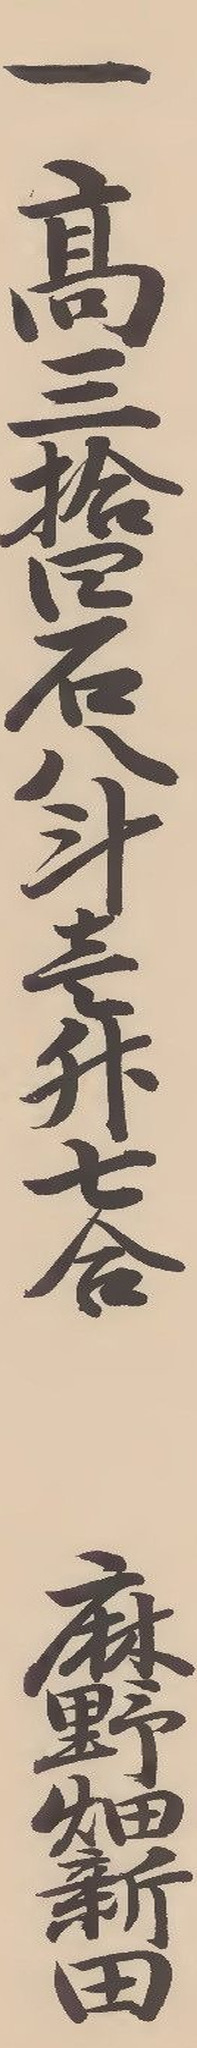一高三拾四石八斗壱升七合麻野畑新田

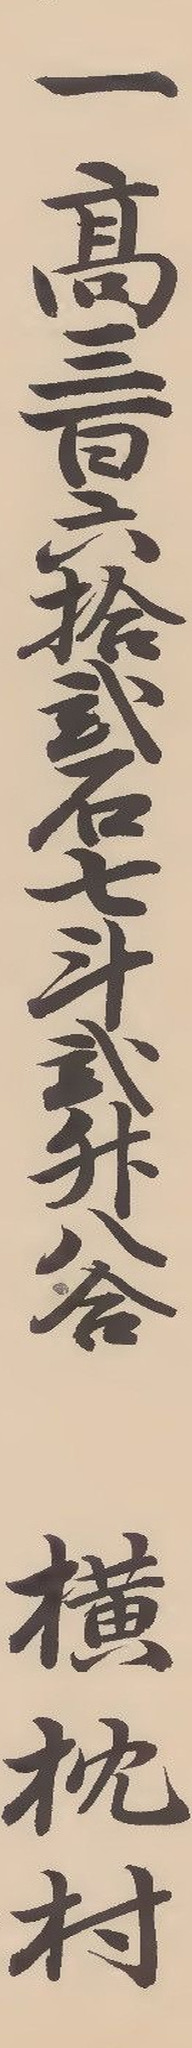一高三百六拾弐石七斗弐升八合横枕村
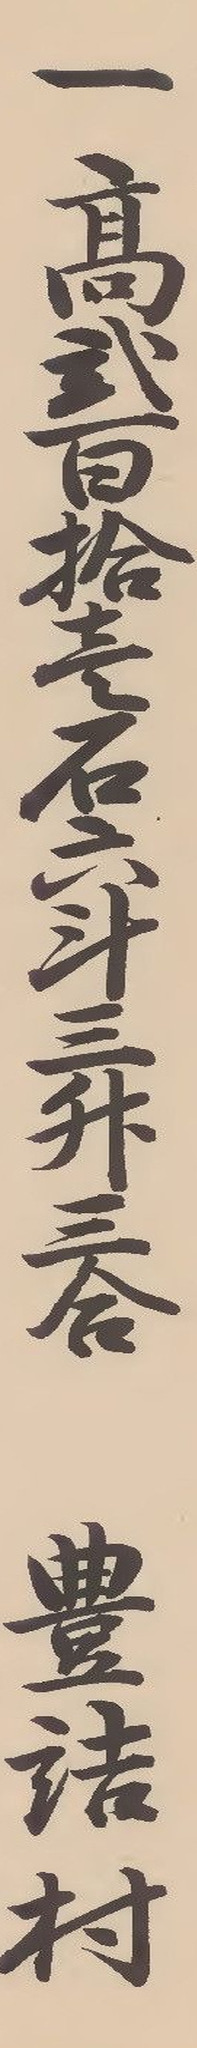一高弐百拾壱石六斗三升三合豊詰村
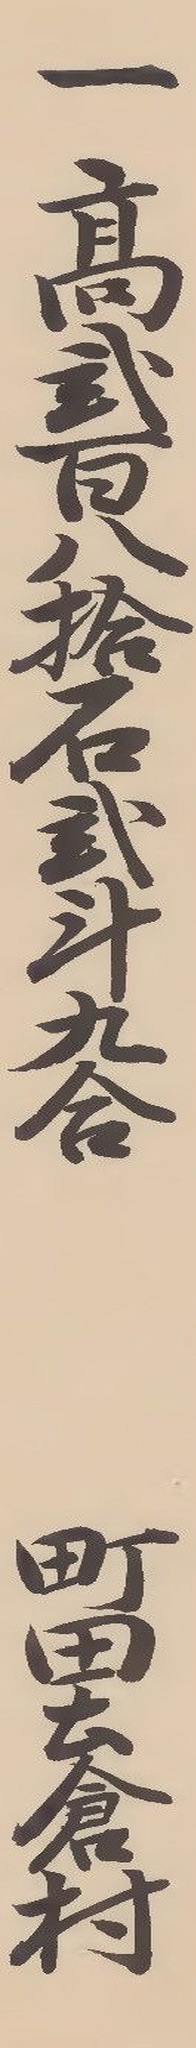一高弐百八拾石弐斗九合町田土倉村
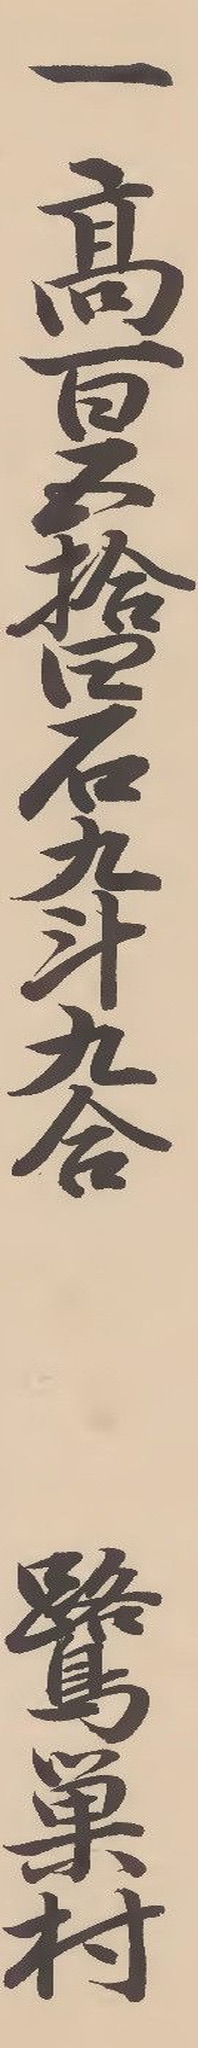一高百五拾四石九斗九合鷺巣村
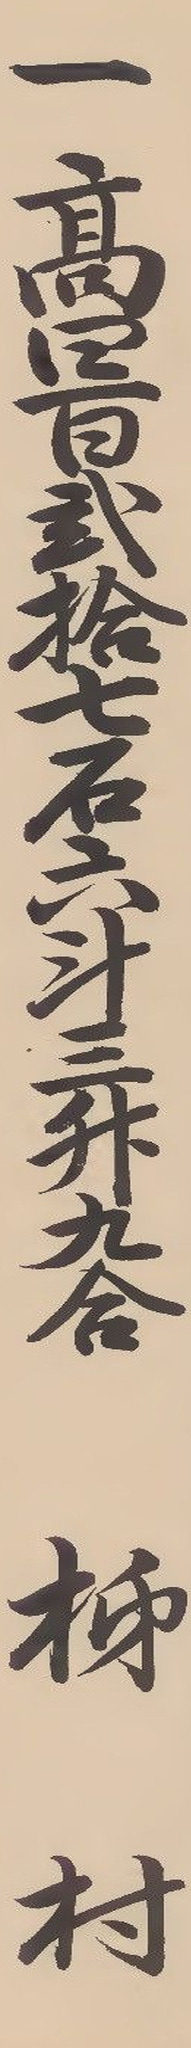一高四百弐拾七石六斗三升九合柿村
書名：越後国郷帳　中
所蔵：国立公文書館 National Archives of Japan
